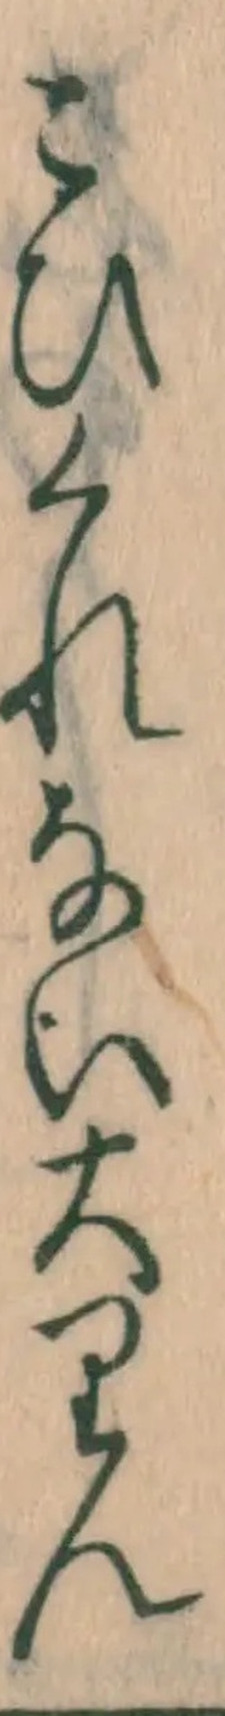こひくれない大りん
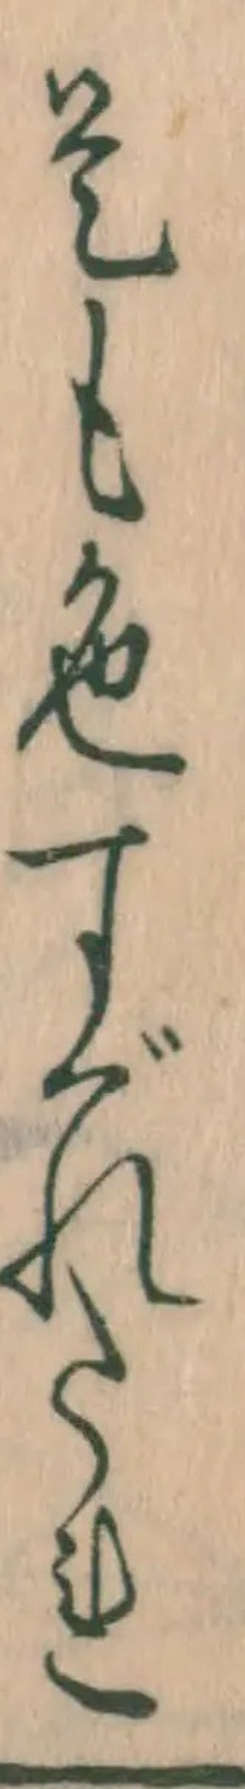是も色すぐれたれ
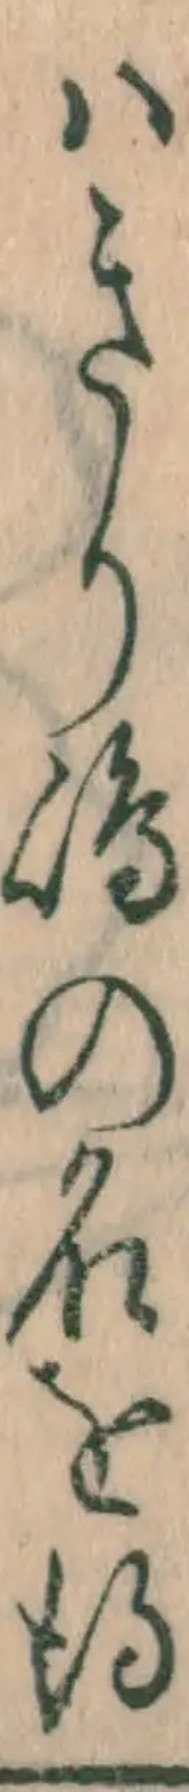はきり嶋の名を得
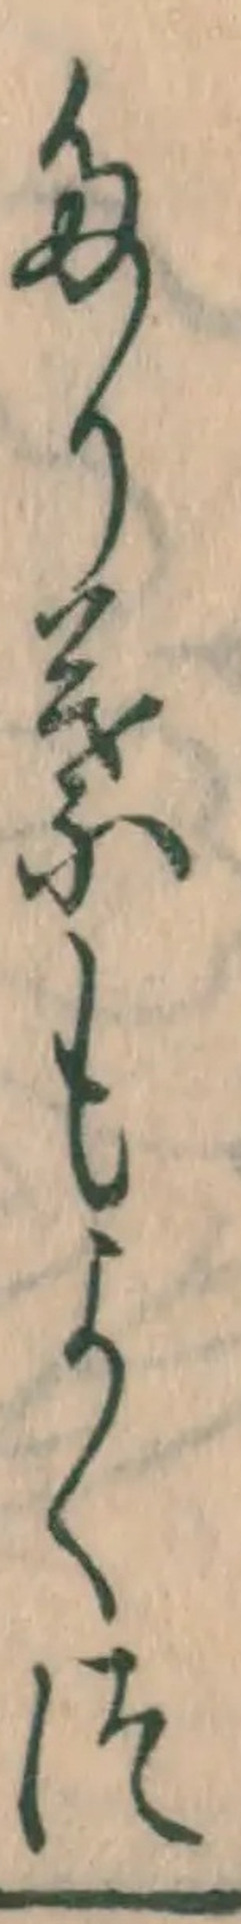たり葉もよくつ
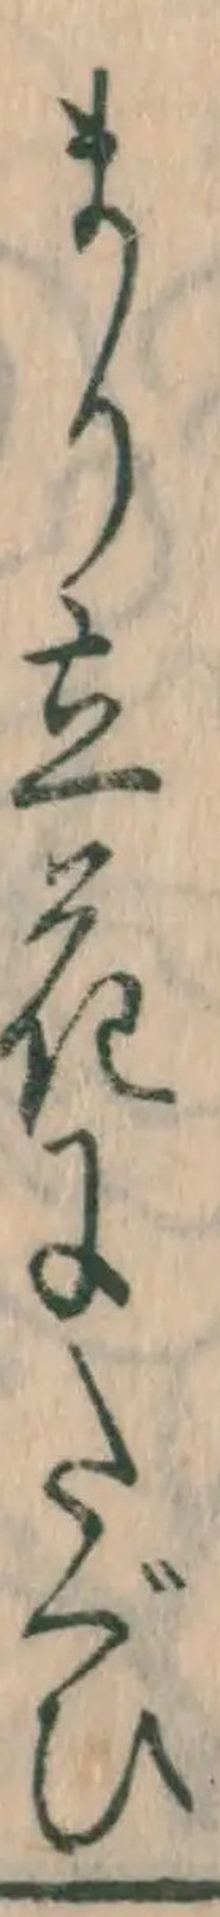まり立花にたぐひ
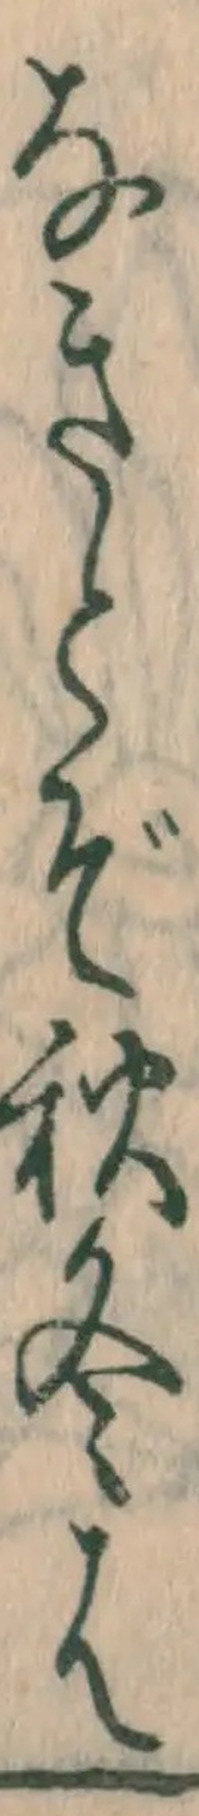なきとぞ秋冬は
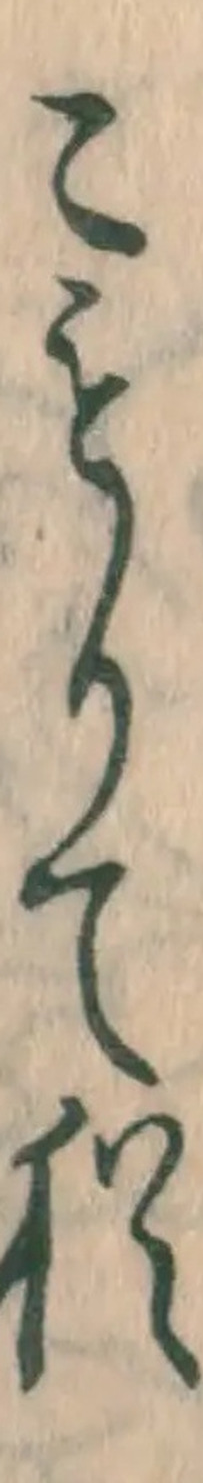こもりて猶

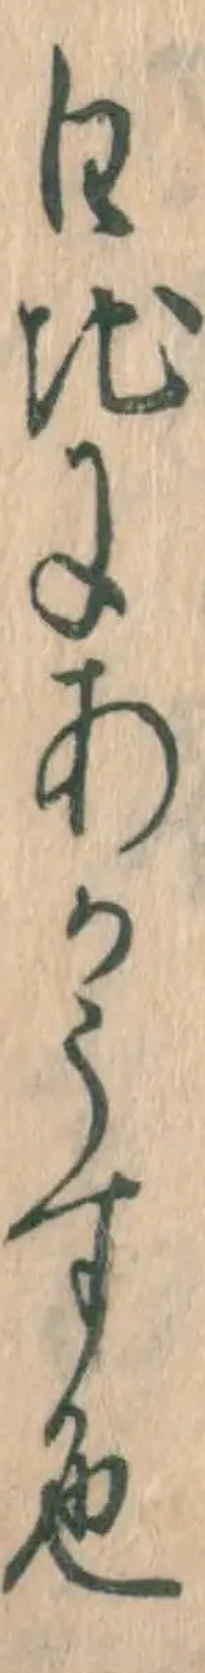白地にあかうす色
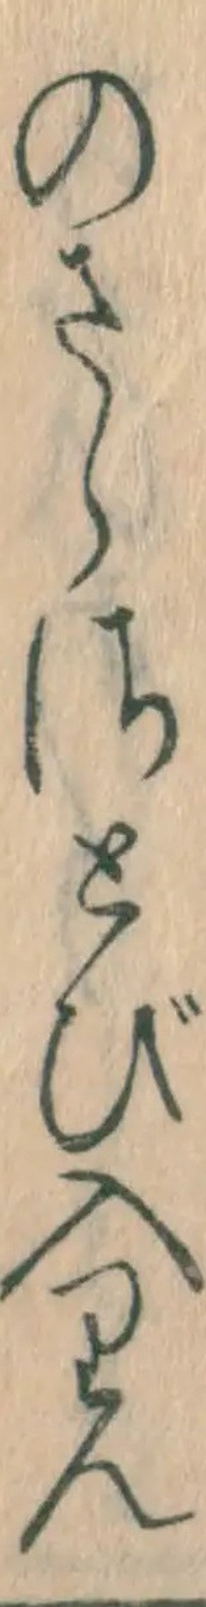のさらさとび入りん

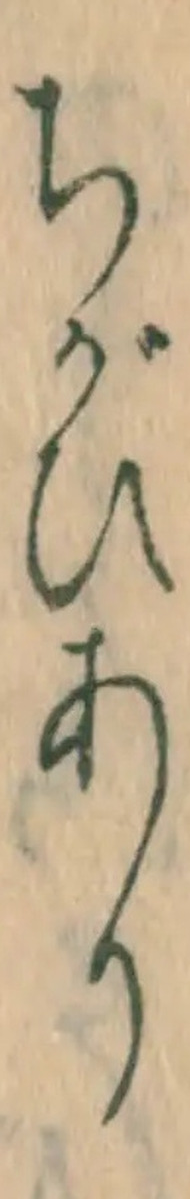ちがひあり
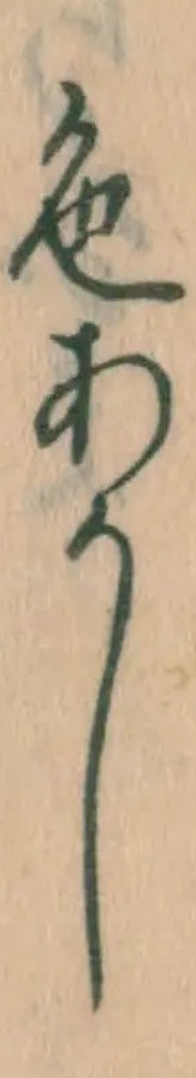色あかし
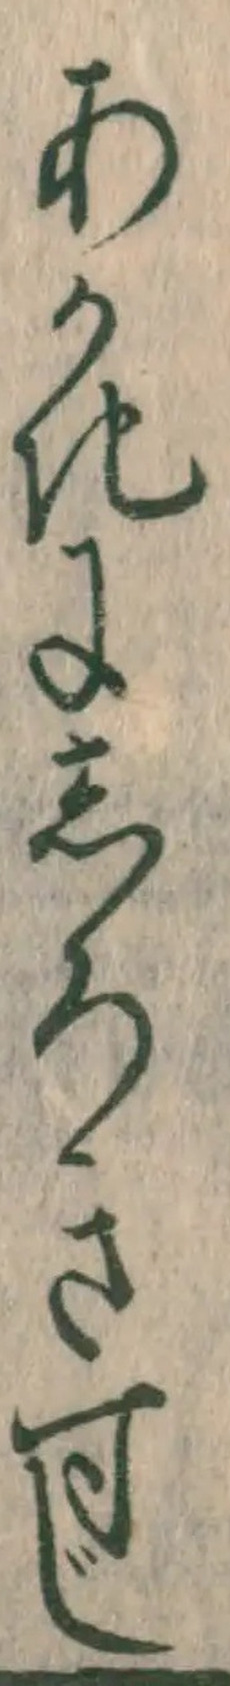あか地にしろきすじ
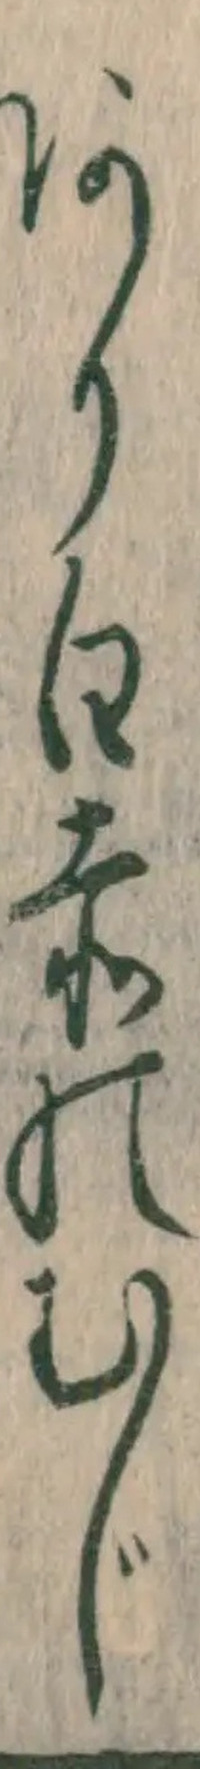あり白赤のむじ
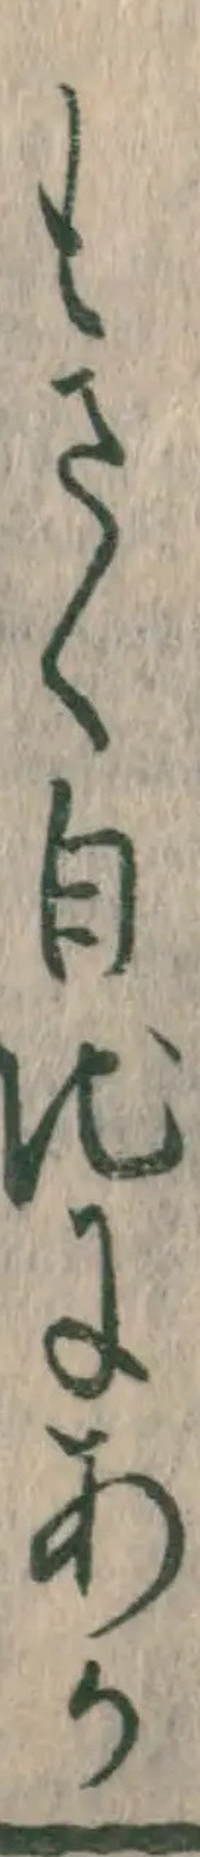もさく白地にあか
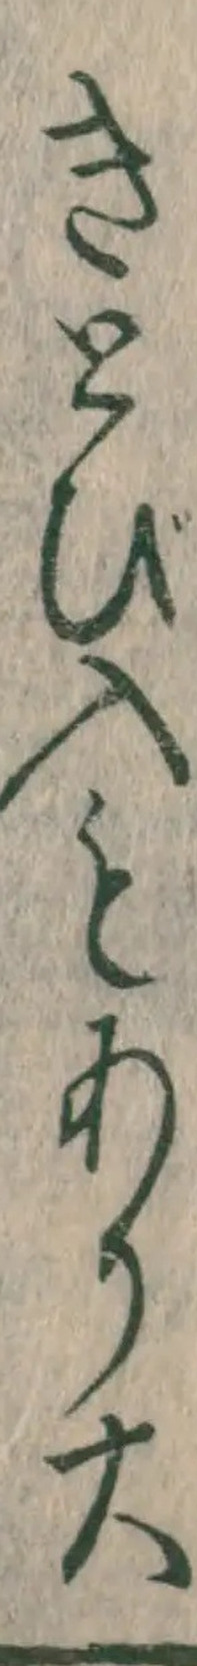きとび入もあり大
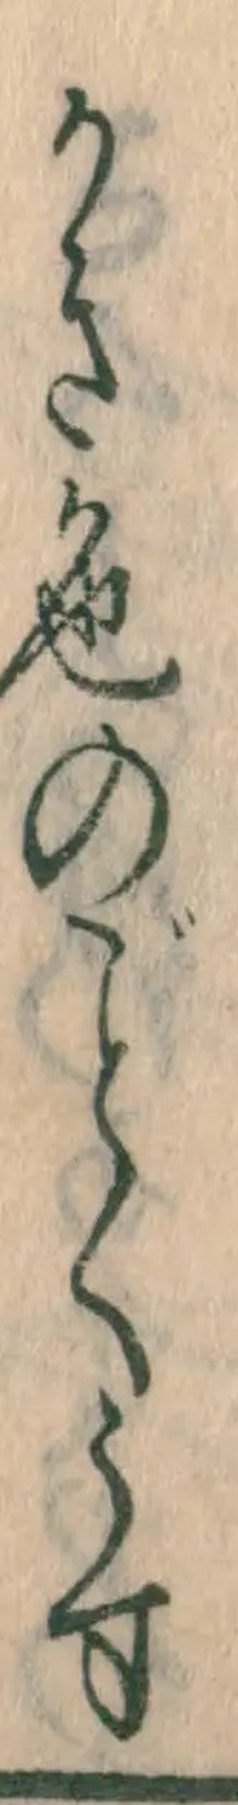かき色のごとくうす
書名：錦繍枕 5巻. [5]
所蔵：国立国会図書館 National Diet Library, JAPAN
